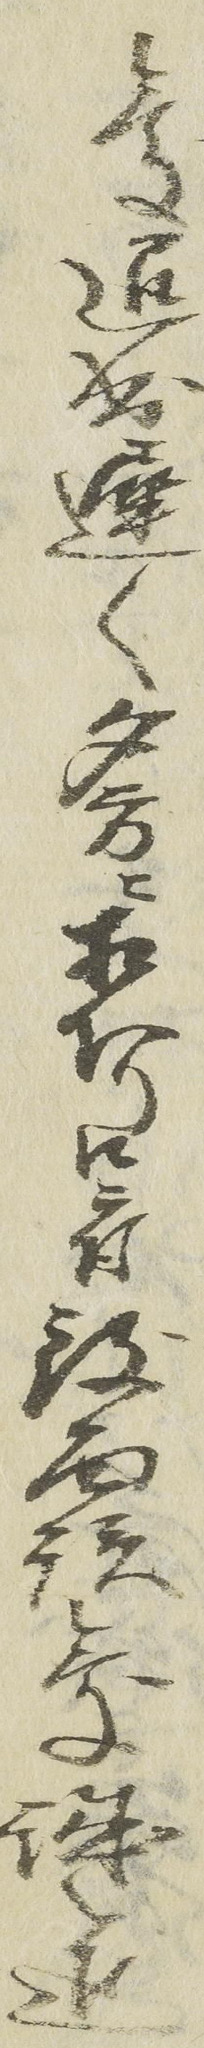候処退出遅く夕方ニ相なり候ニ付致面談候処誠之進
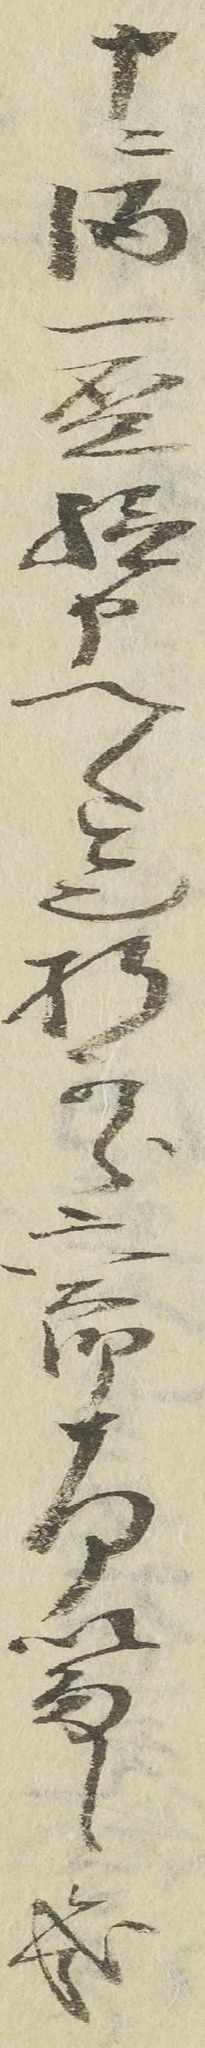申ニ酒一盃始申へくと也折から六郎如何いたし候哉
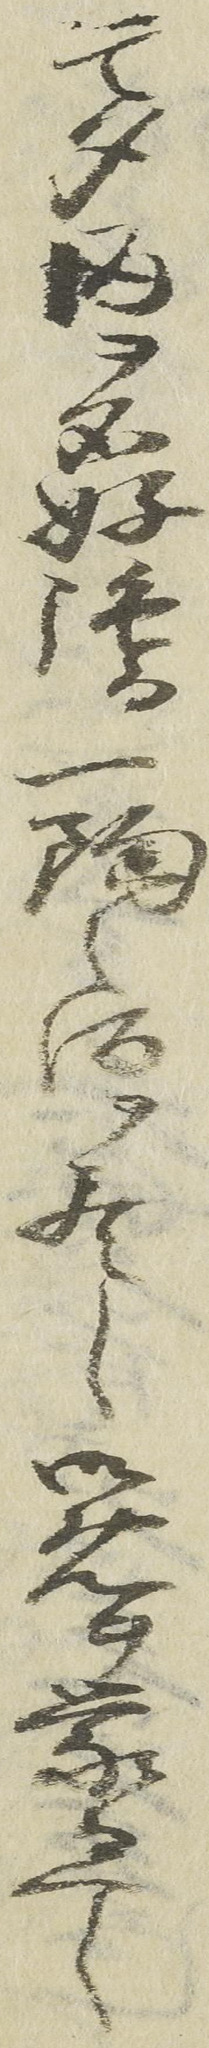其夕酒ヲ不好強而一陶之酒ヲ尽し御免ヲ蒙るへし
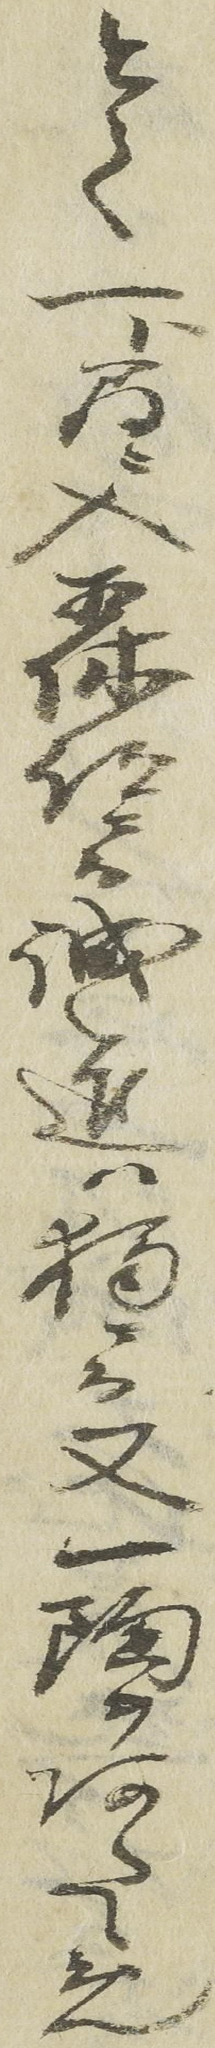とて一ト間ニ入相休位ニ而誠之進ハ柄杓ニ而又一陶ヲあたゝめ

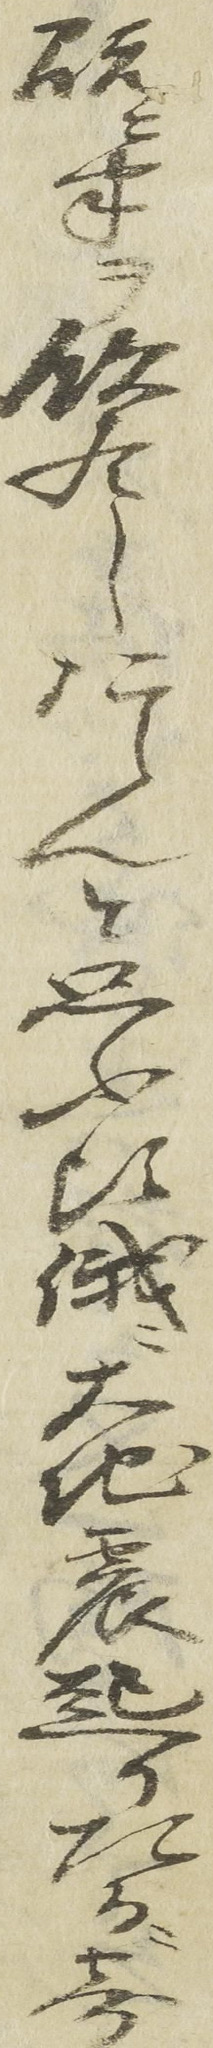既二半ヲ飲尽したらんと思ふ比俄二大地震起りたるニ寄
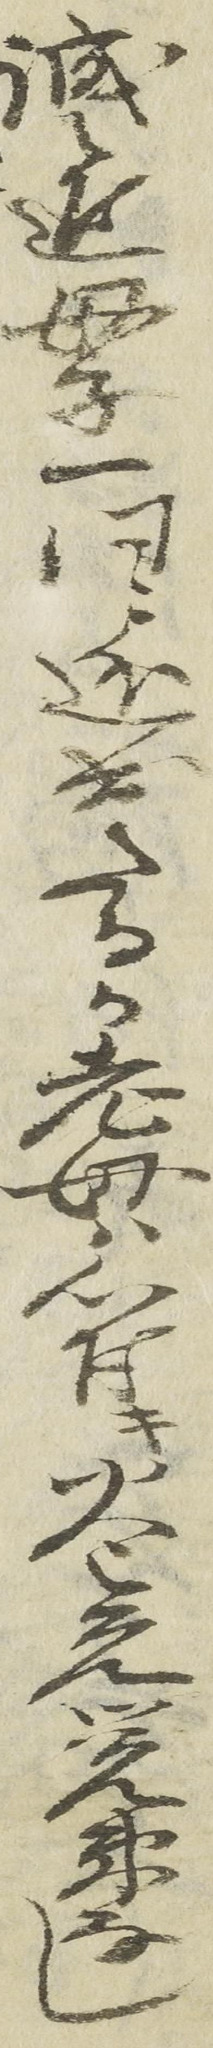誠之進母子一同ニ逃出たるか老母ハ心付キ火之元覚束なし
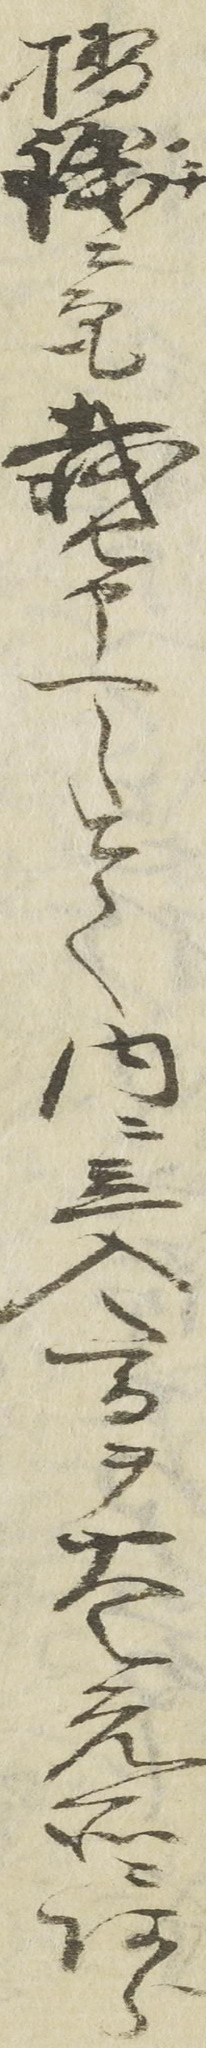摺鉢ニ而も載セ申へしとて内二立入たるヲ火之元所二あら
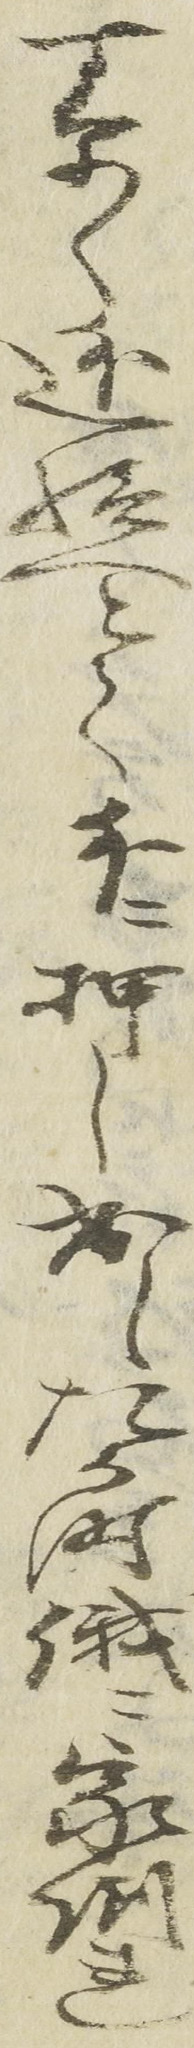す早〻逃給へとて外ニ押し出したる時俄ニ家倒れ
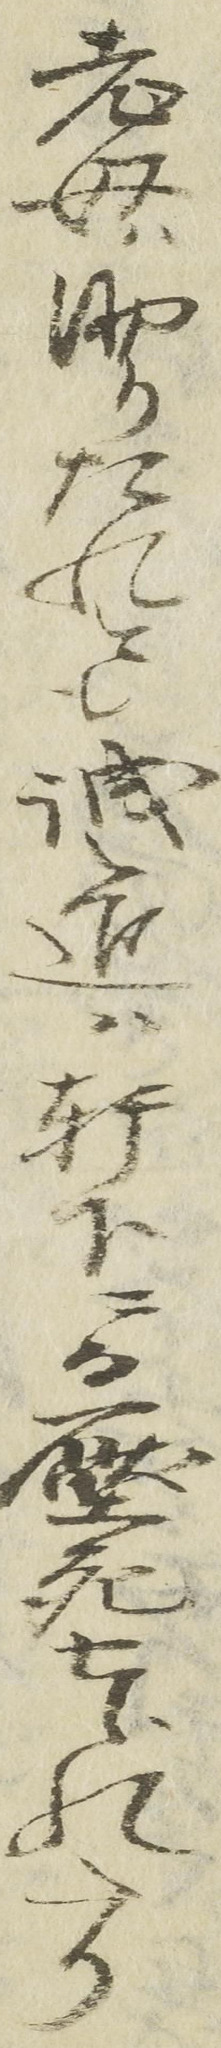老母ハ助りたれとも誠之進ハ軒下ニ而圧死セられたり
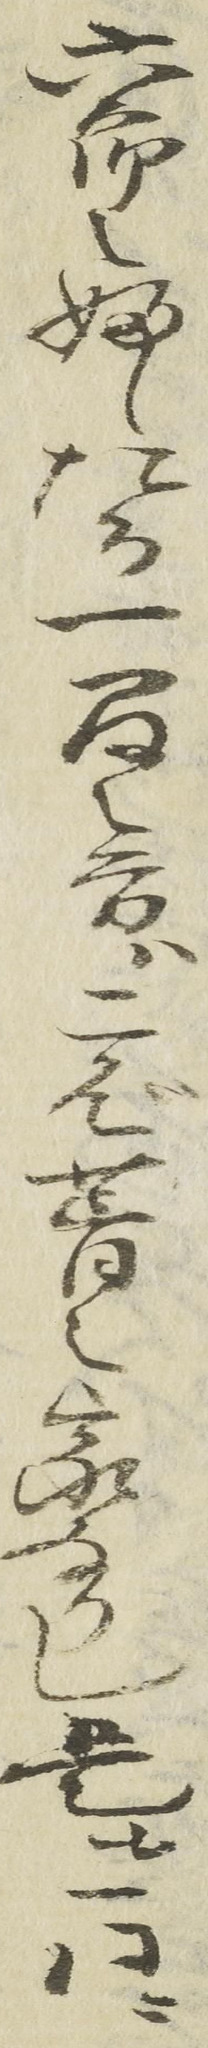六郎之ふしたる一間之方ハこそ葺之家なりし是も一同二
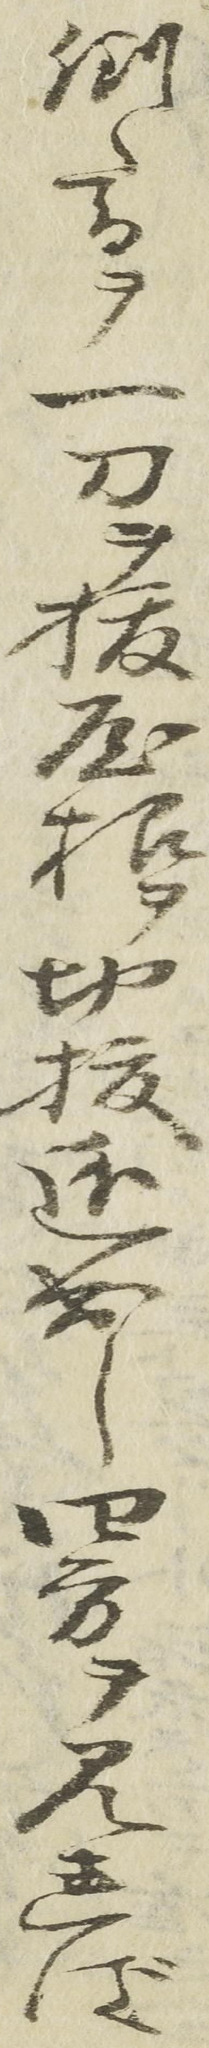倒たるヲ一刀ヲ祓屋根ヲ切祓逃出し四方ヲ見れば
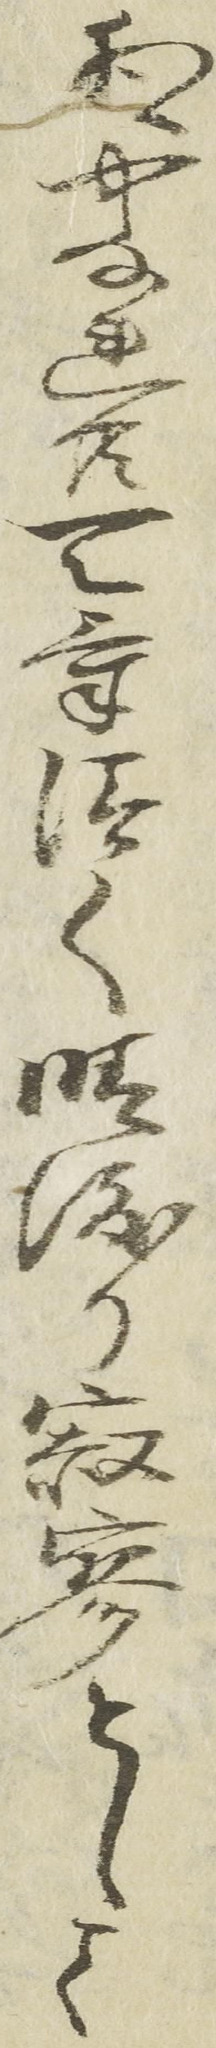夜中なれ共天気清く晴渡り寂寥として
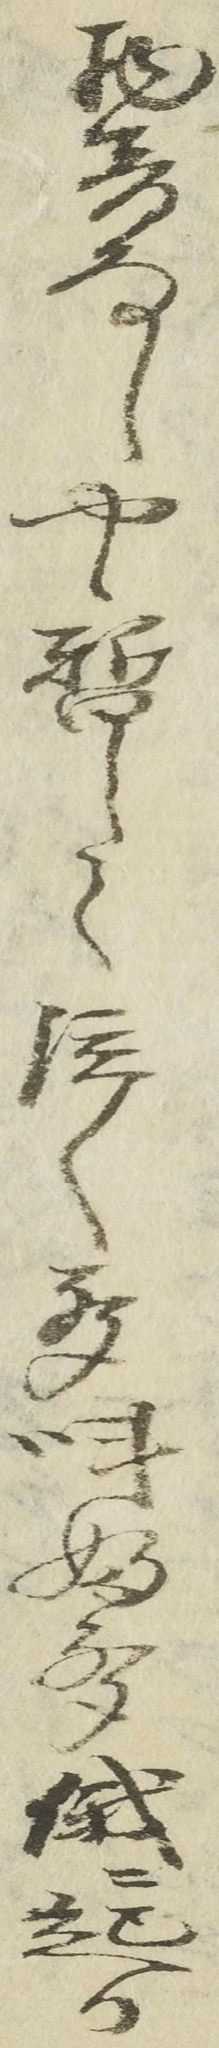物音なし中暫して泣く聲叫ふ聲俄二起り
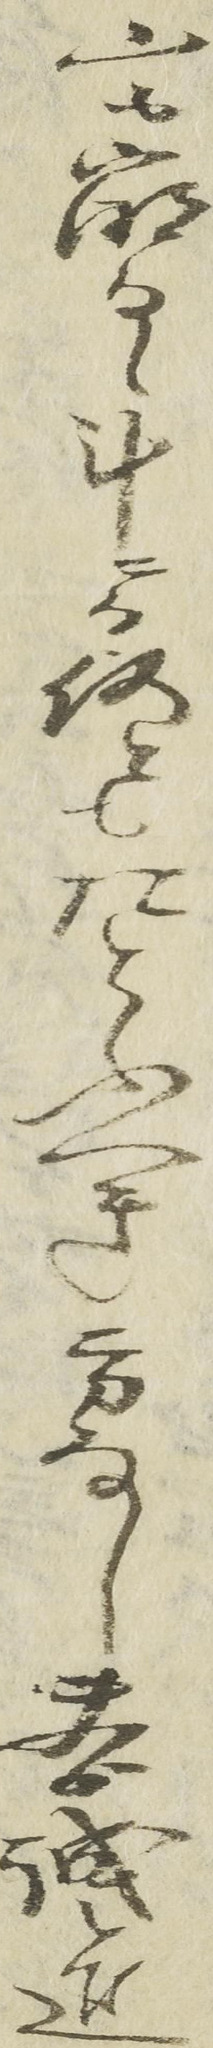山も崩るゝ斗ニ而何ともたとふへき方なし夫ゟ誠之進
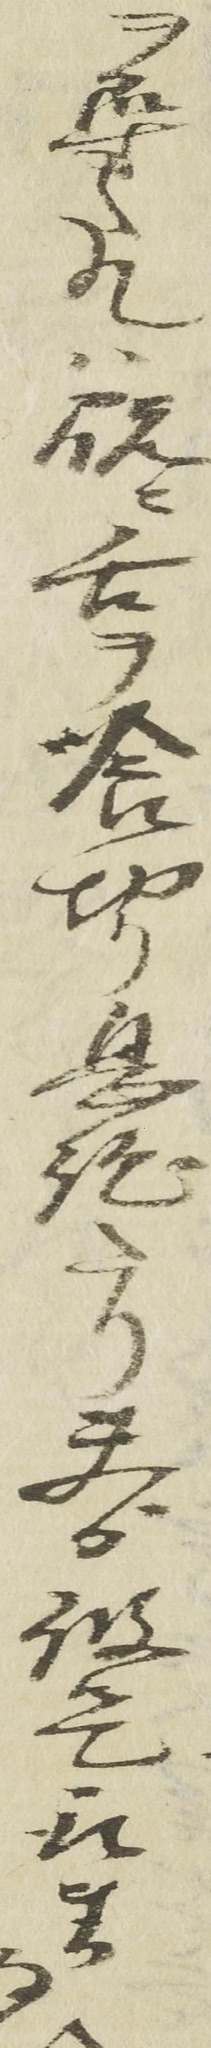ヲ尋たれハ既二舌ヲ喰切り息絶たり夫ゟ彼是取まつろひ
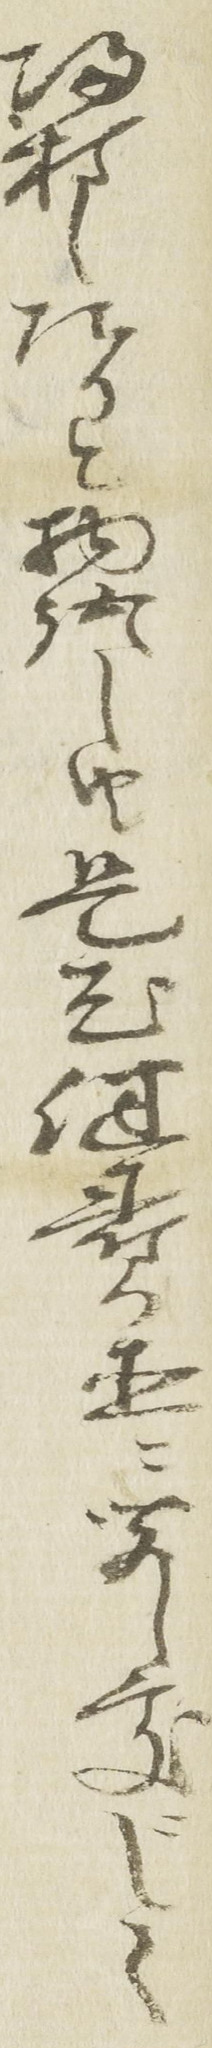帰村したりと物語し由是尤健壽か直二聞し処ニして
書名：安政乙卯江戸大地震筆記　安政丙辰八月大阪大雷雨之記追加　安政三辰年七月松前辺大地震并八月大風雨記録
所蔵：東京大学地震研究所図書室 Earthquake Research Institute Library, The University of Tokyo, JAPAN
